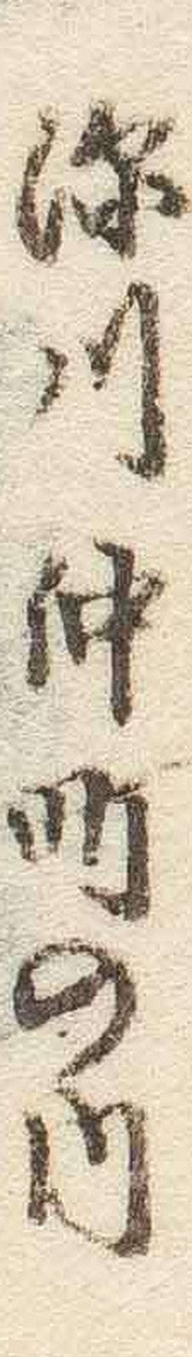深川仲町の内
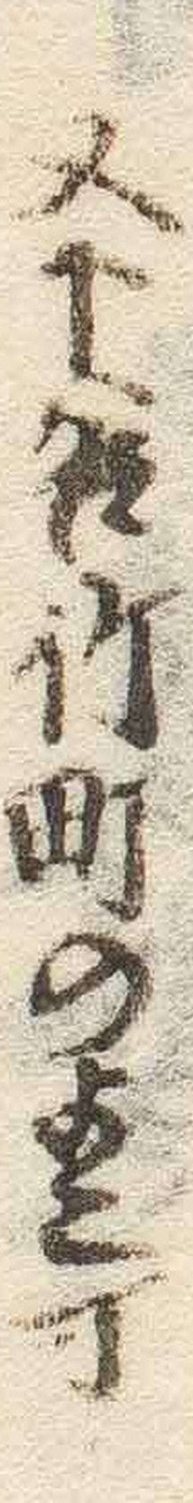又下谷竹町のよこ丁
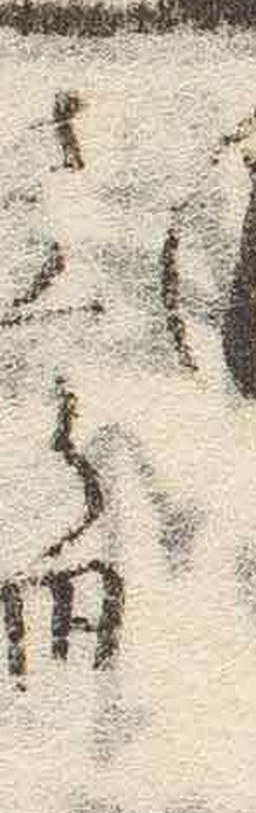さくら田
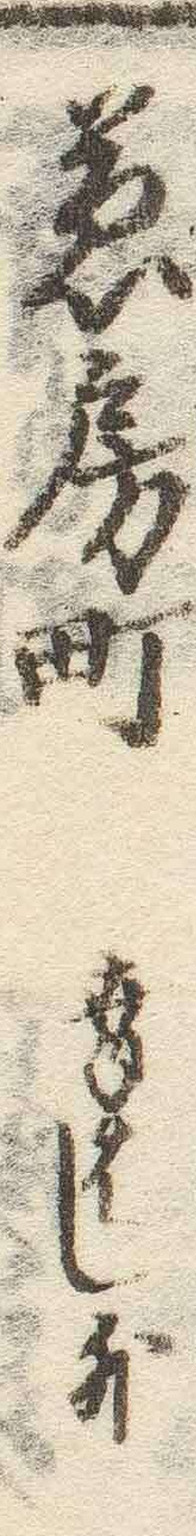兼房町幸はし外
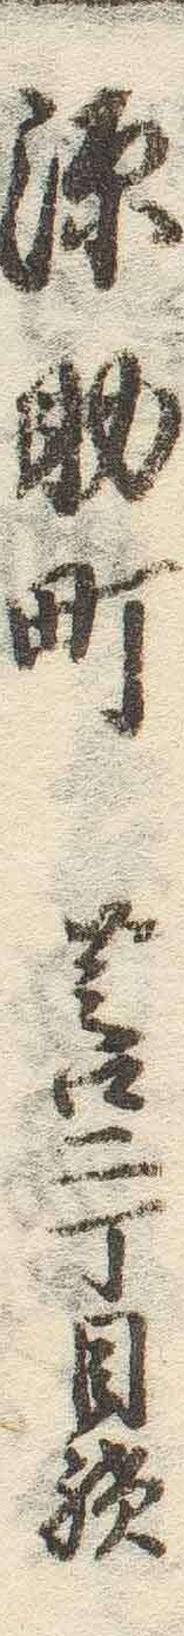源助町芝口二丁目続
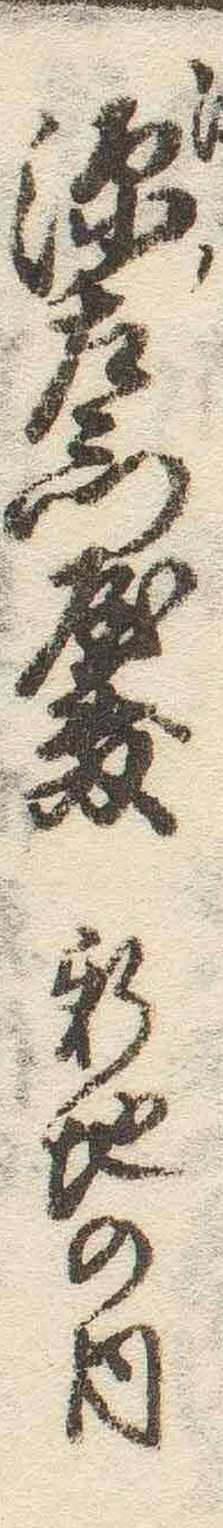源左衛門屋敷新地の内
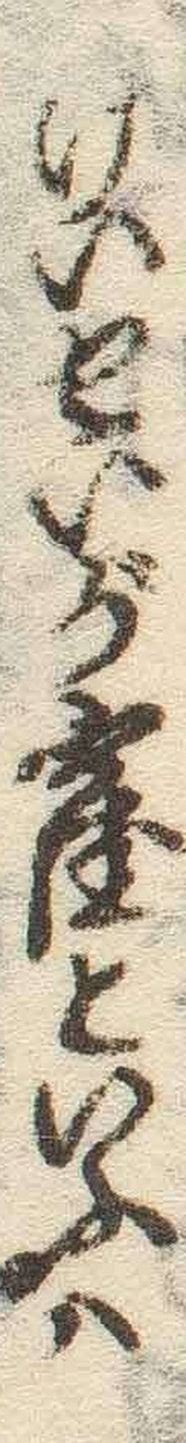けいせいが窪といふは
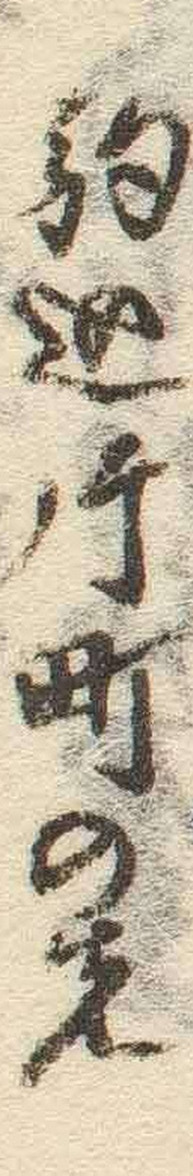駒込片町の先
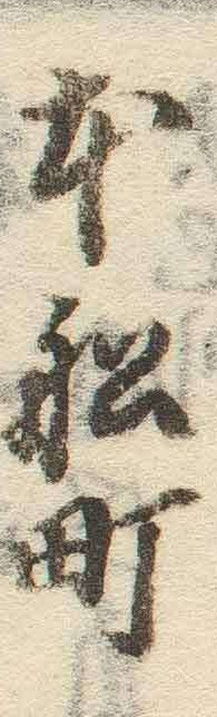本舩町
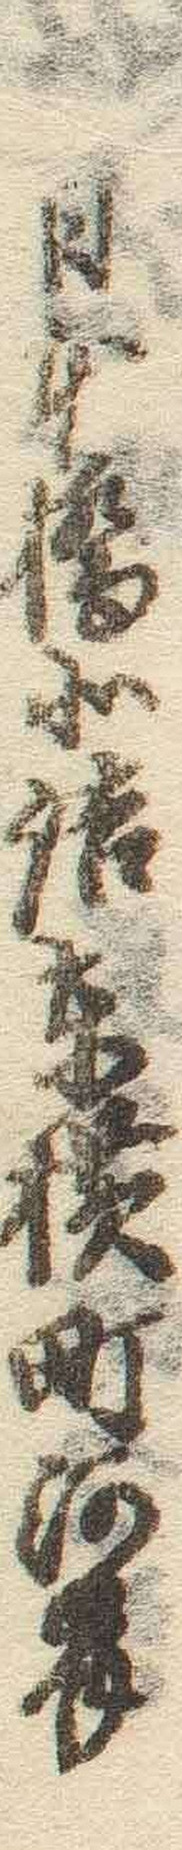日本橋北詰東横町河岸
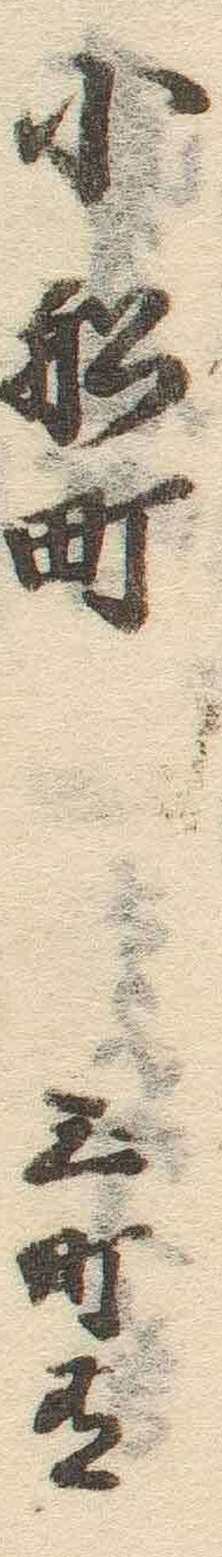小舩町三町有
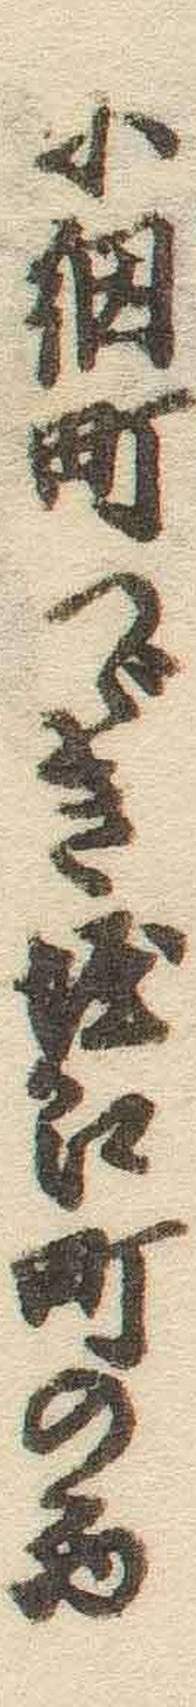小網町つゞき堀江町の西

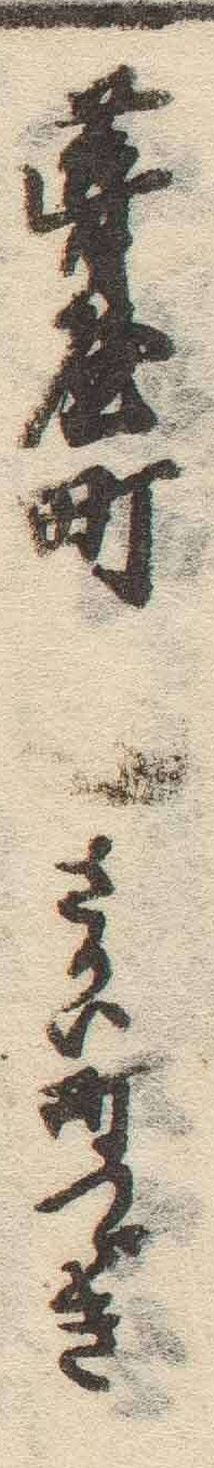葺屋町さかい町つゞき
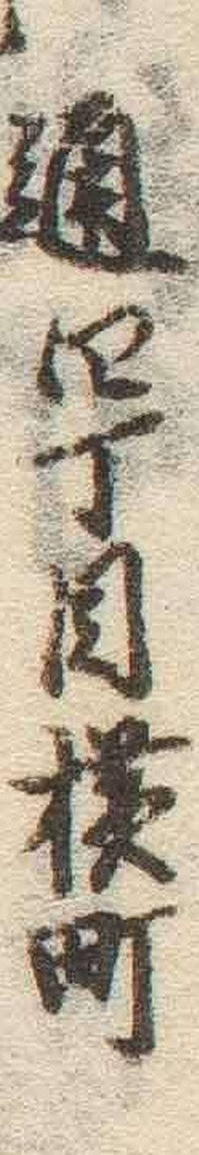通四丁目横町
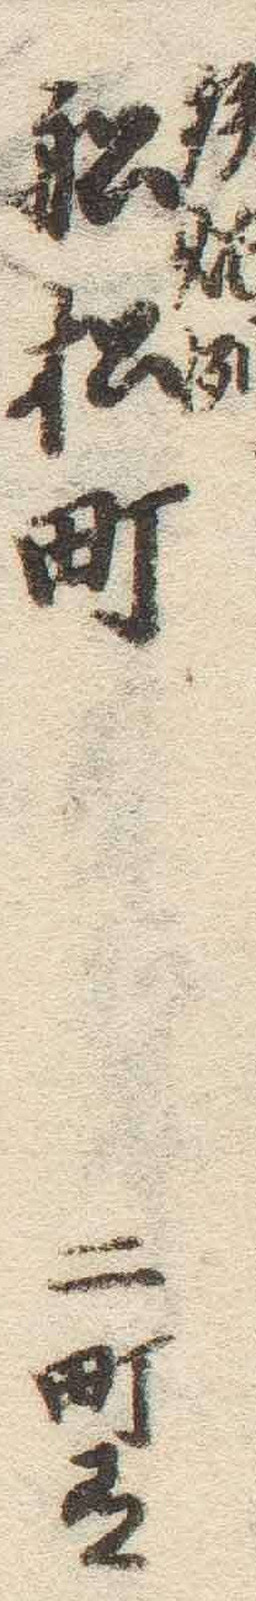船松町二町有
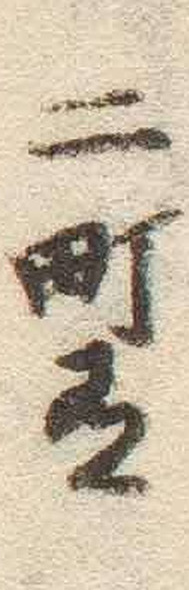二町有
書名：江戸町独案内
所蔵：東京学芸大学附属図書館 国文学研究資料館
